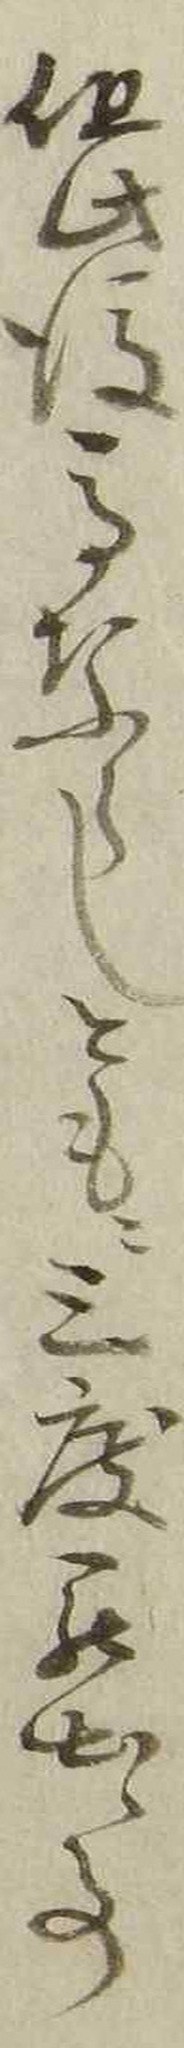但此後馬ならしともニ三度罷出候事
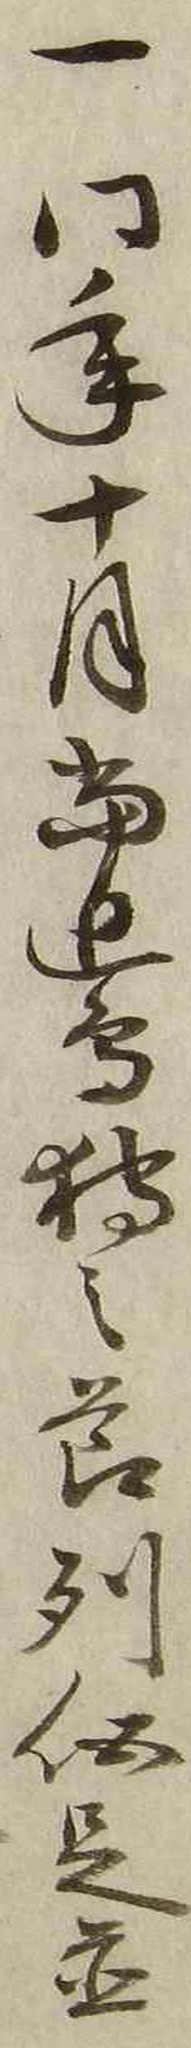一同年十月当追鳥狩之節列伍足並
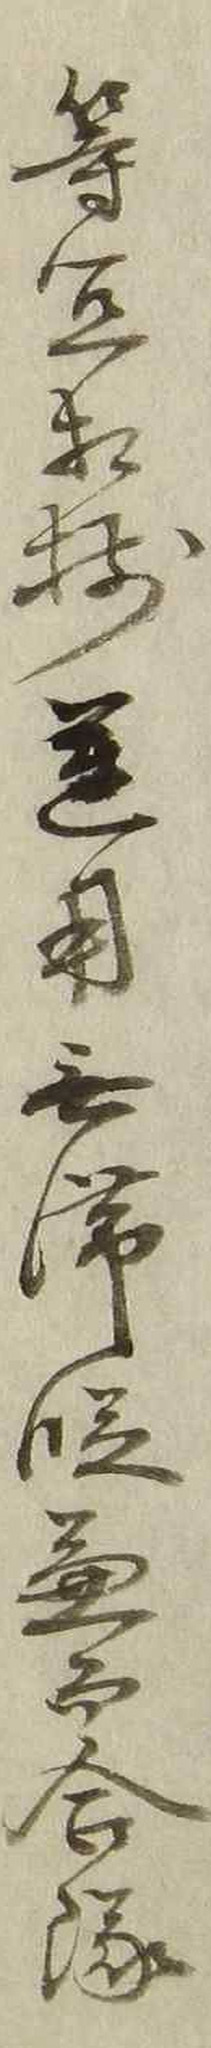等宜相揃運用無滞段兼而合隊
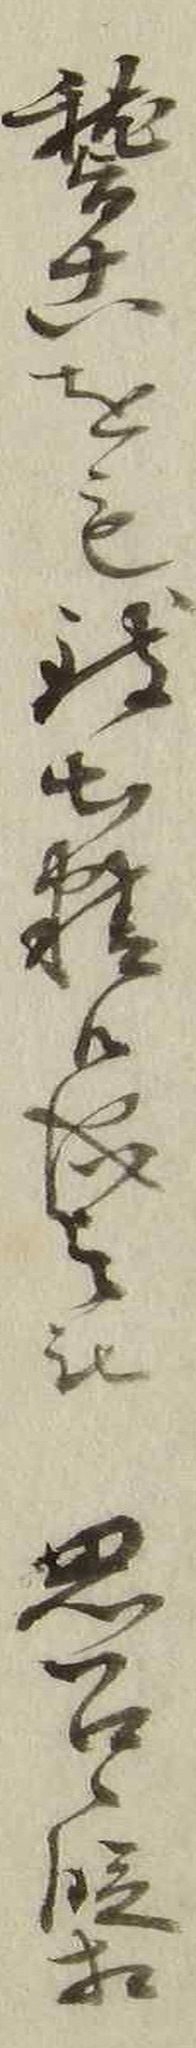稽古をも致出精候儀与被思召候段相
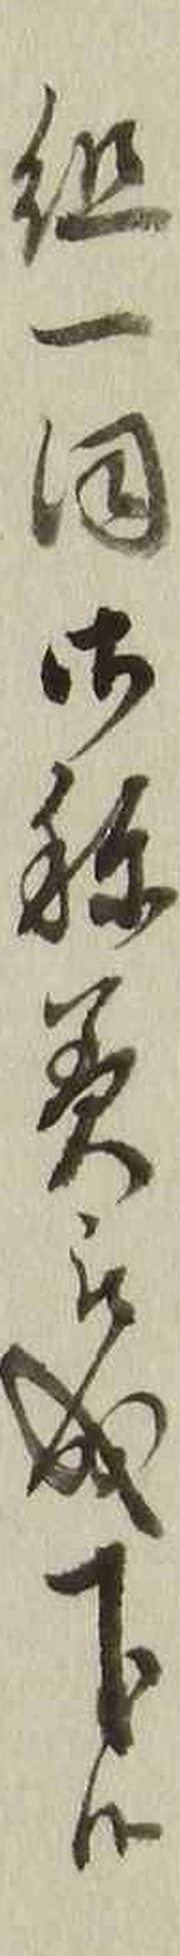組一同御称美被成下候
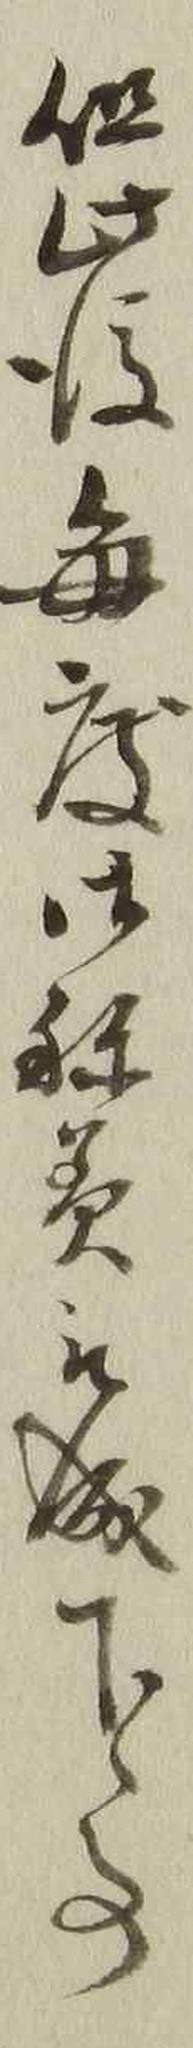但此後毎度御称美被成下候事
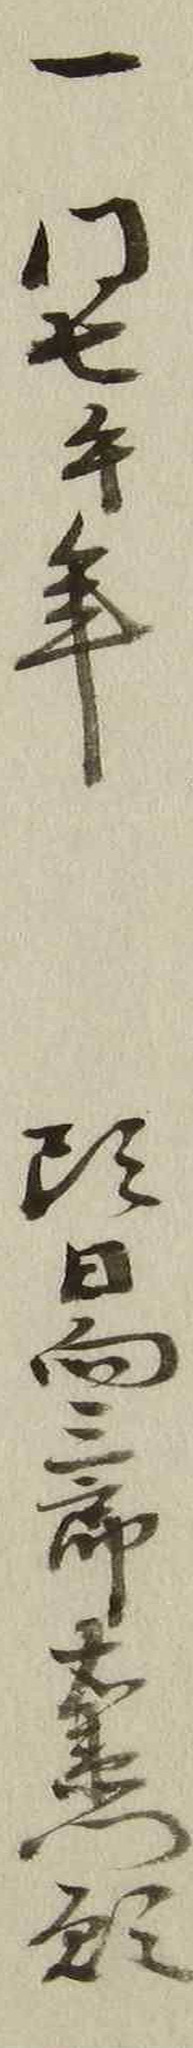一同七午年頭日向三郎右衛門願
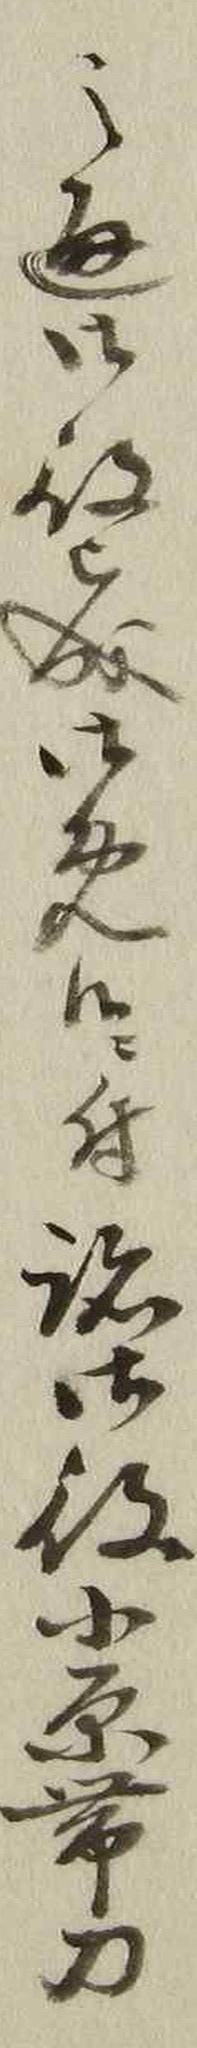之通御役被成御免候ニ付跡御役小原帯刀
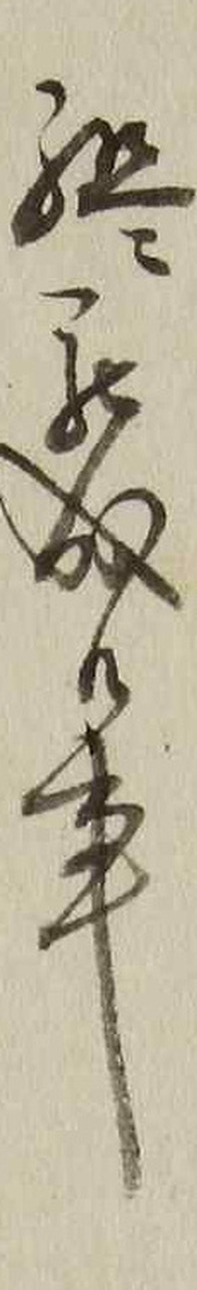組ニ罷成候事
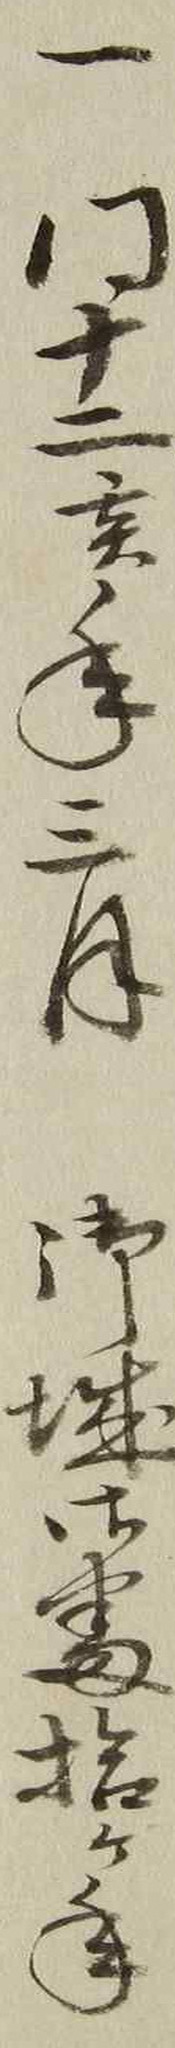一同十二亥年三月御城御番拾ケ年
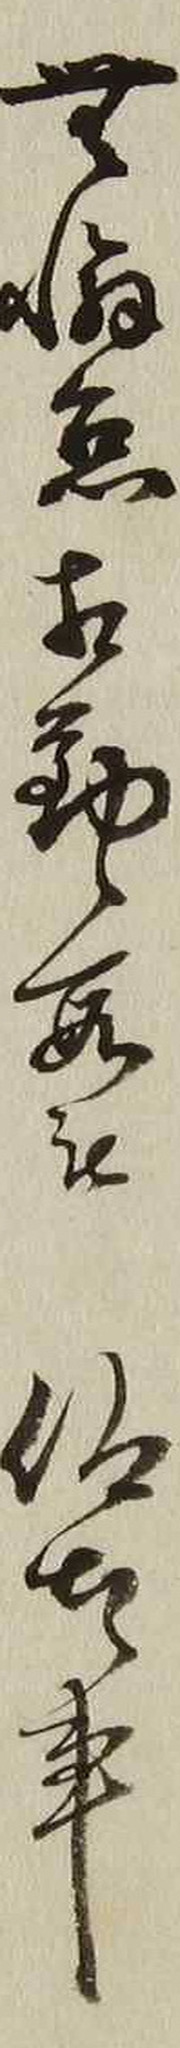無懈怠相勤候段被仰出候事
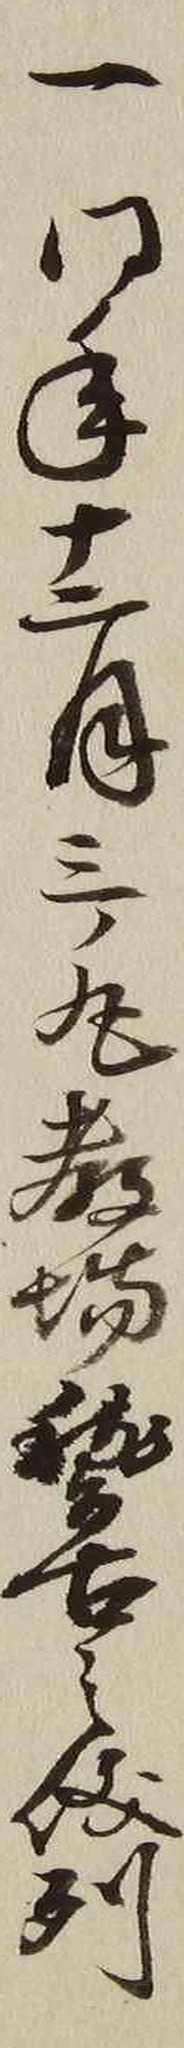一同年十二月三ノ丸教場稽古之儀列
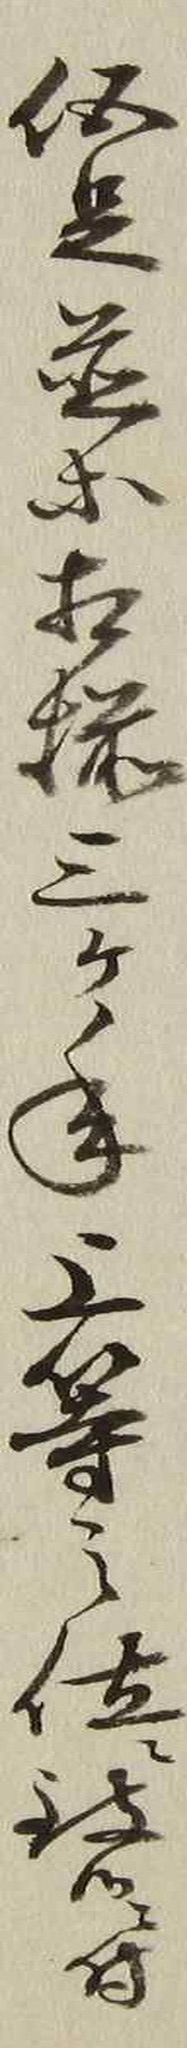伍足並等相揃三ケ年上等之位ニ致候ニ付
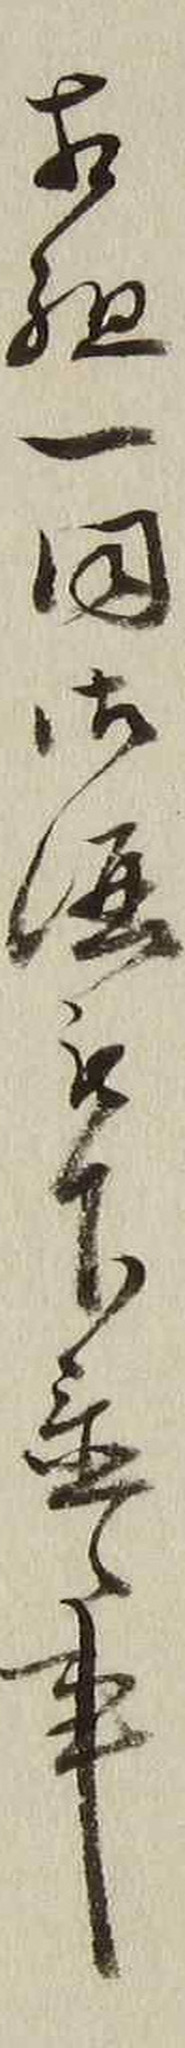相組一同御酒被下置候事
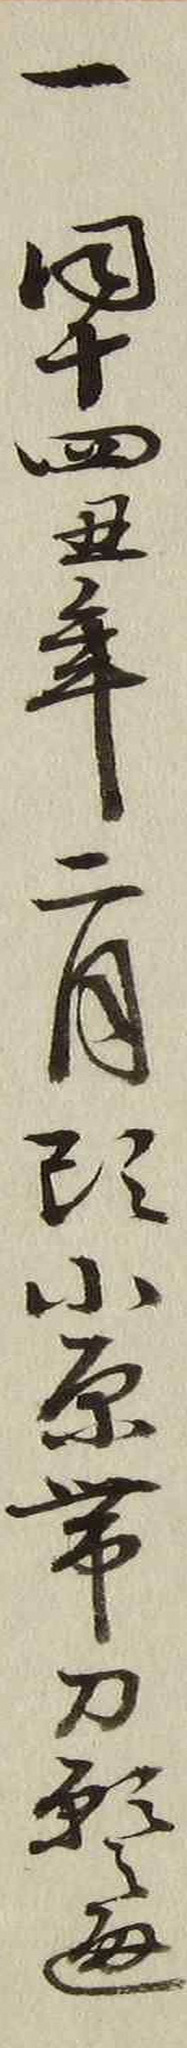一同十四丑年二月頭小原帯刀願之通
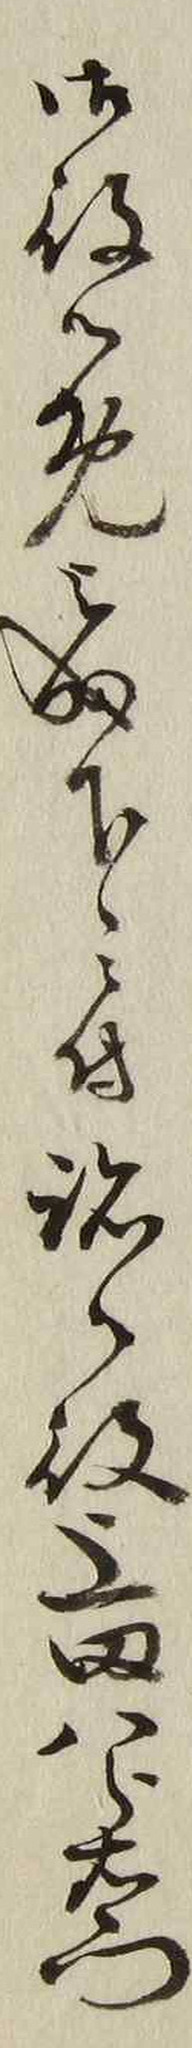御役御免被成下候ニ付跡御役上田八郎右衛門
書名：諸士系譜　巻之27　い之部27
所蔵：会津若松市立会津図書館
